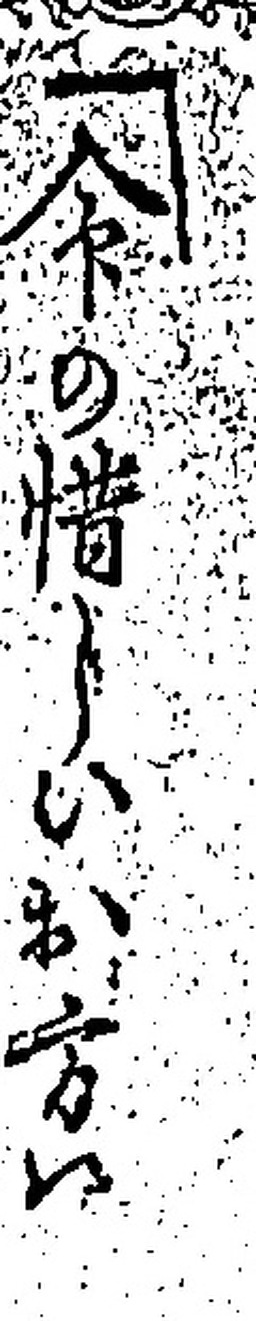こと命の惜しいお方は
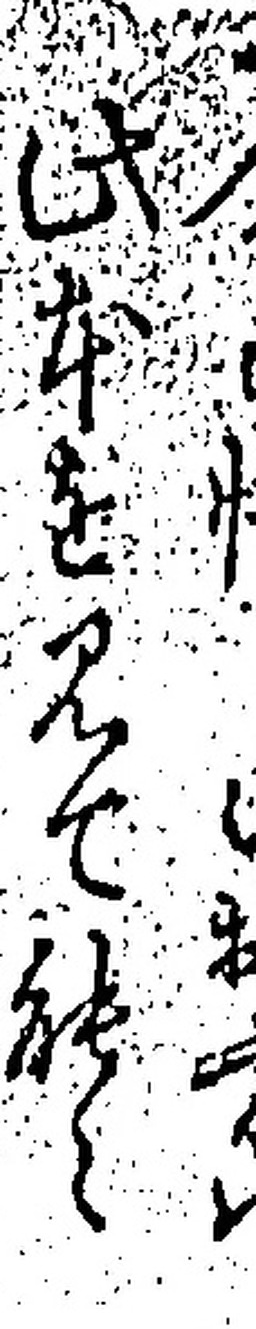此本を見て能々
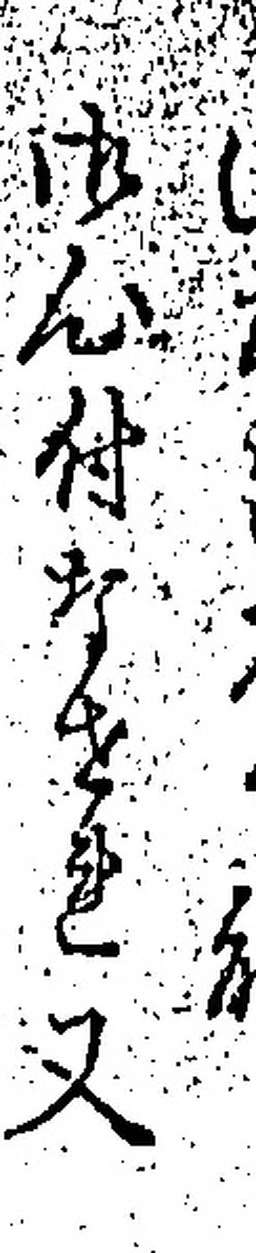御心付なせれ又
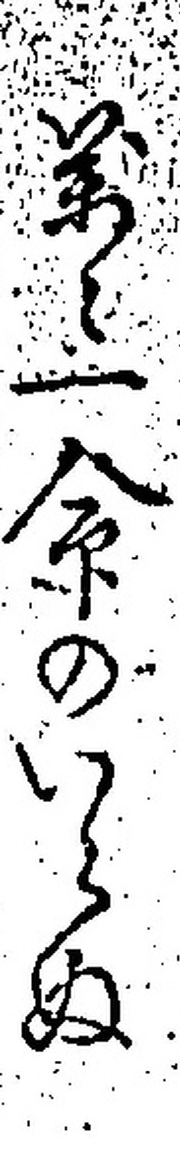万々一命のいらぬ
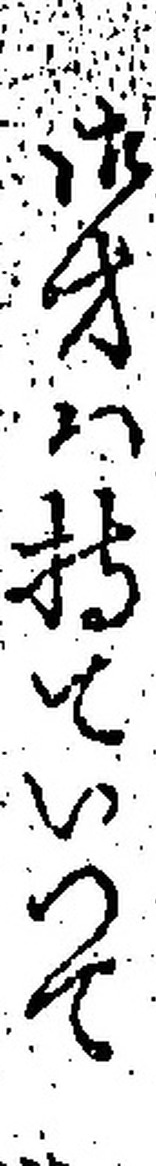御方は持ていつて
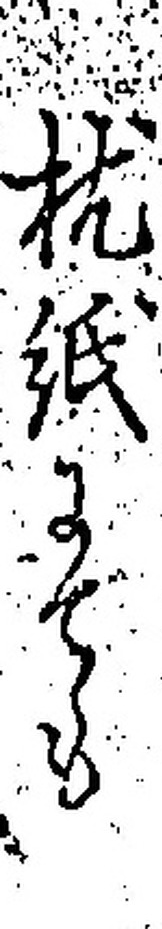枕紙にでも
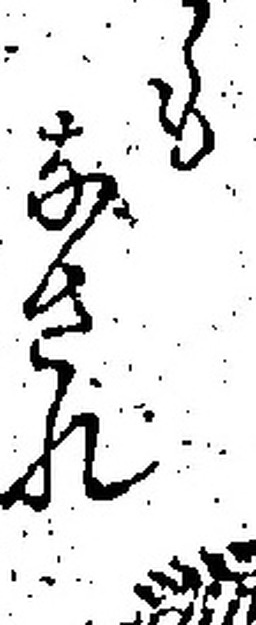なされ
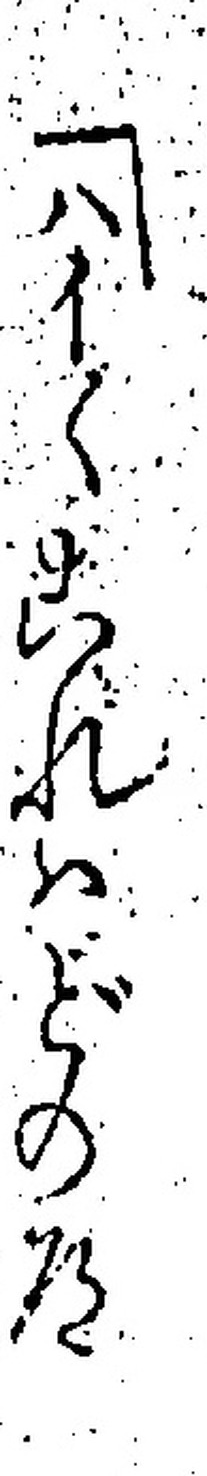ことハイ〳〵これはどの道
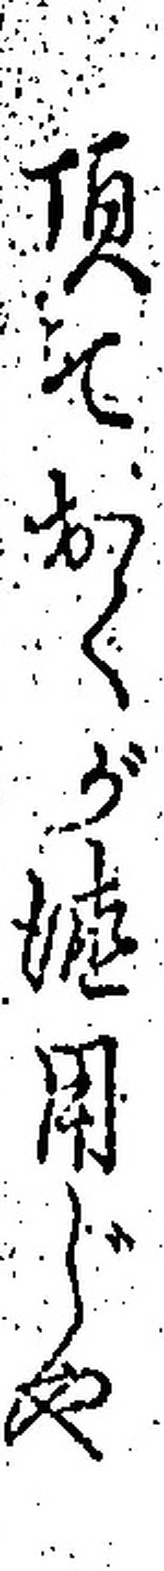頂ておくが燃用じや
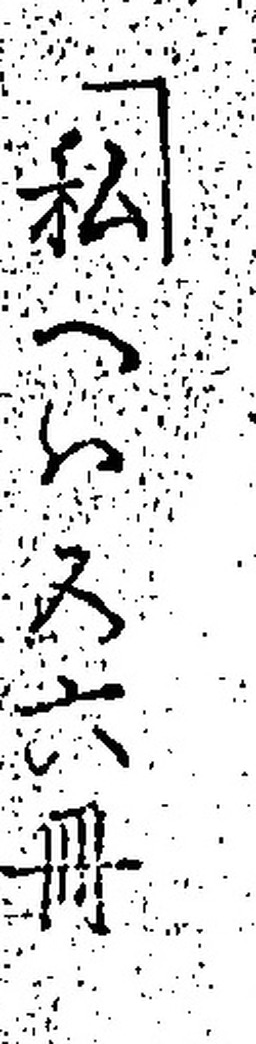こと私へは五六冊
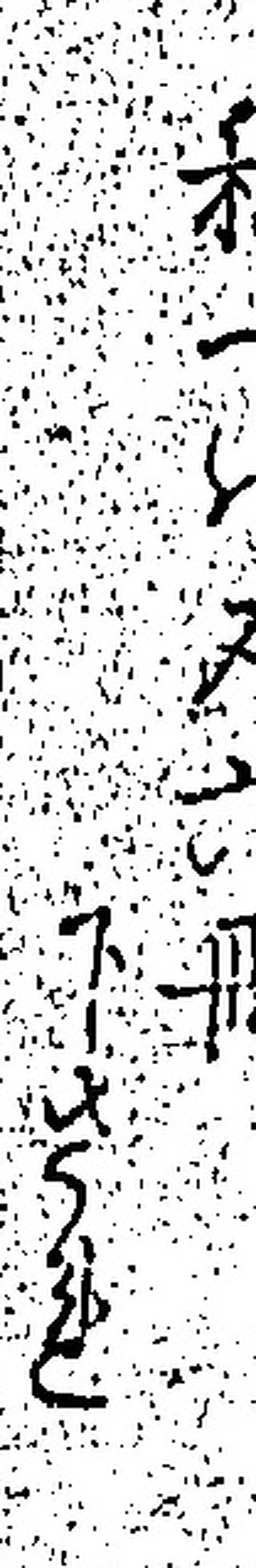下され
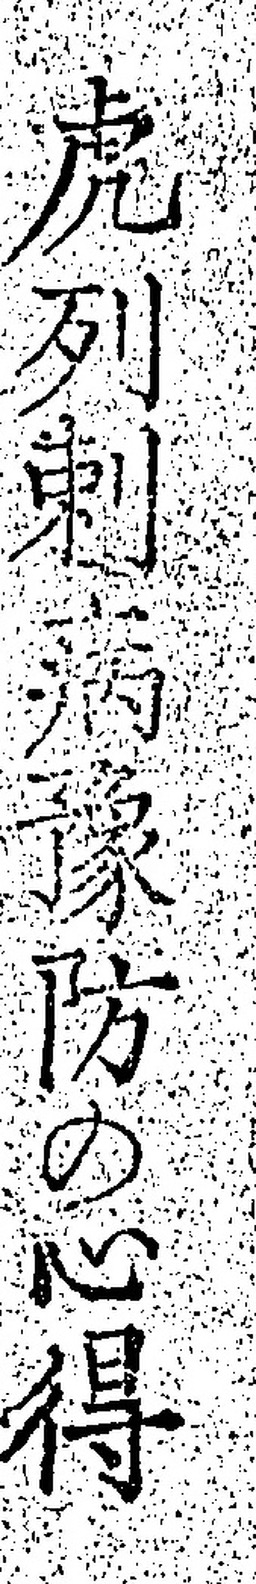虎列刺豫防の心得

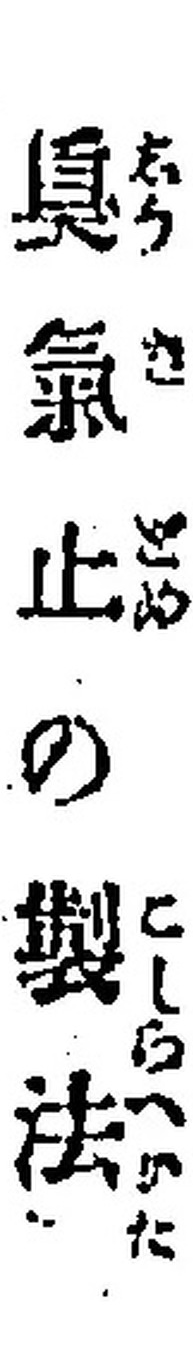臭気止の製法
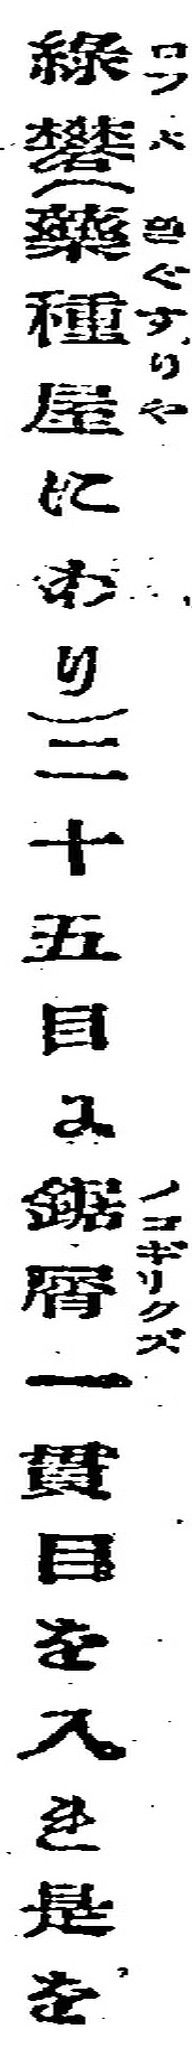緑礬[薬種屋にあり]二十五目に鋸屑一貫目を入れ是を
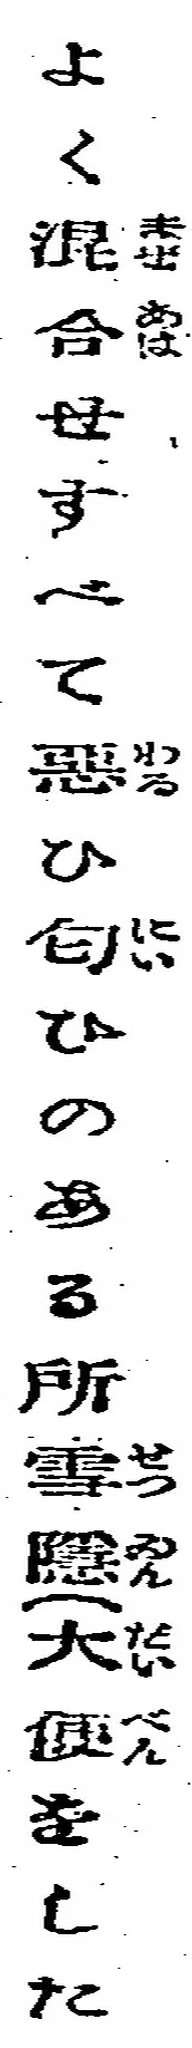よく混合せすべて惡ひ匂ひのある所雪隠[大便をした
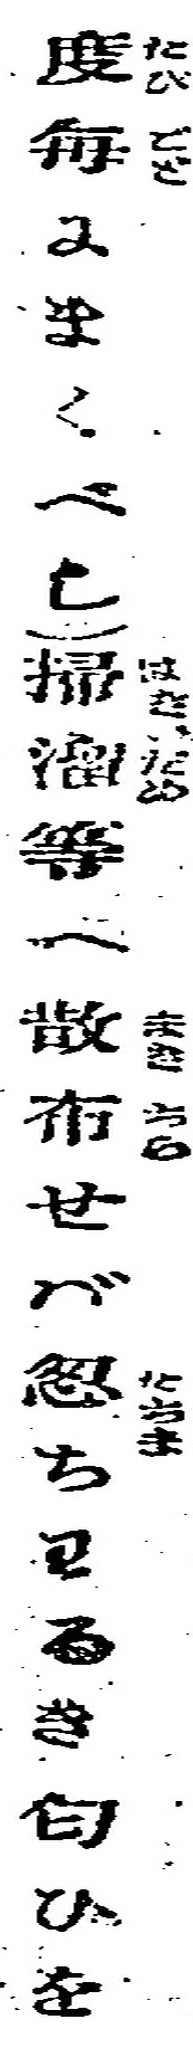度毎になくべし]掃溜等へ散布せば忽ちわるき匂ひを
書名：虎列剌病予防の心得
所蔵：国立国会図書館 National Diet Library, JAPAN
